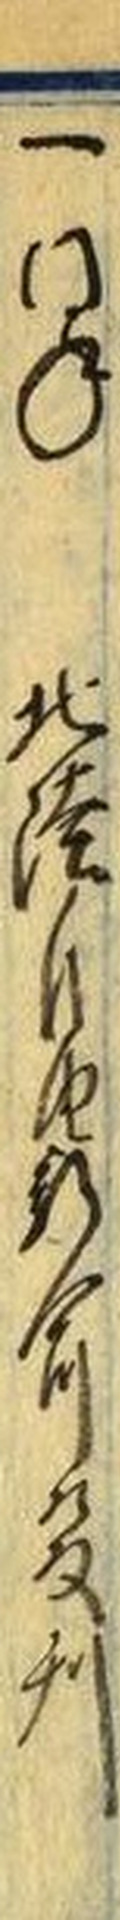一同年北陸自由新聞発刊
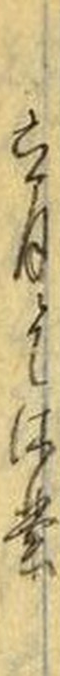六ケ月にて休業

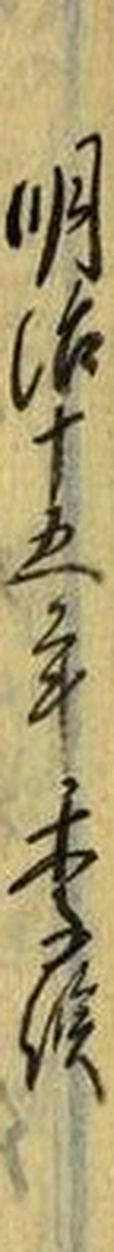明治十五年季候
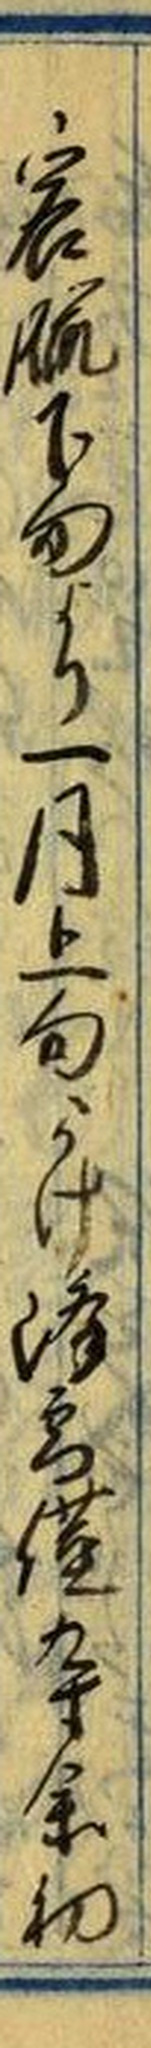客臘下旬より一月上旬へかけ降雪僅九寸余初
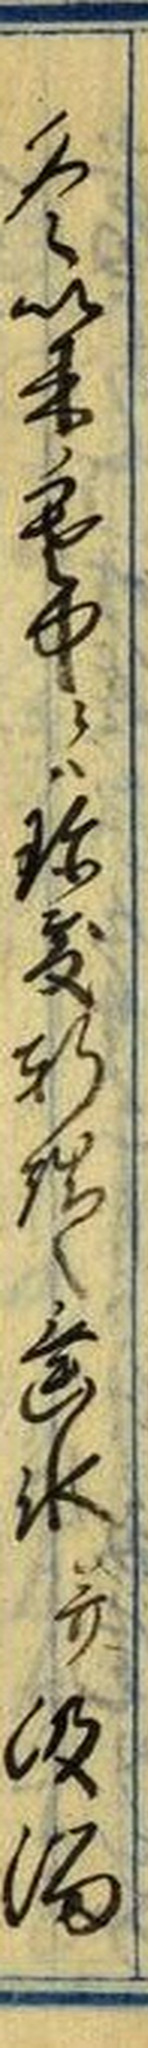冬以来の寒中には珍敷軒端之垂氷并汲溜
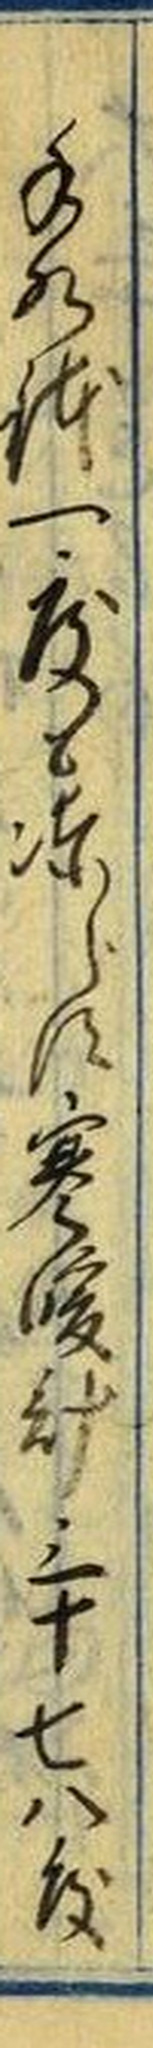手水鉢一度も凍らす寒暖計三十七八度
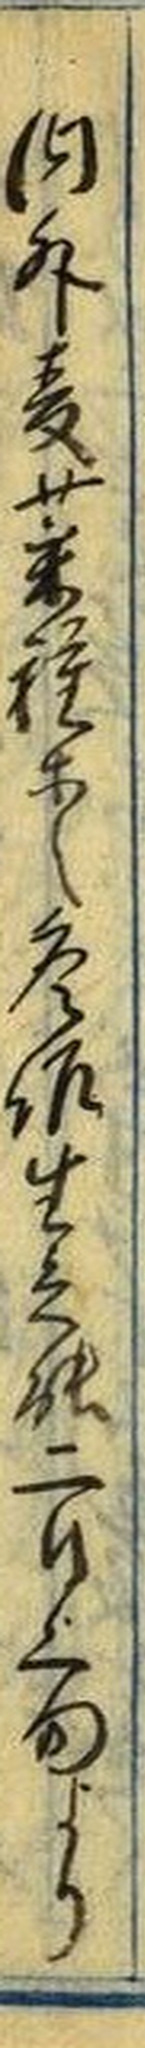内外麦菜種等之冬作生立能二月上旬より
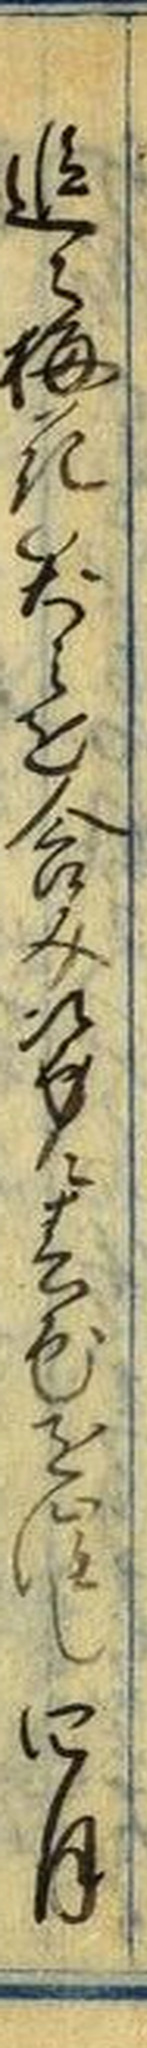追々梅花笑みを含み次第に春色を催し四月
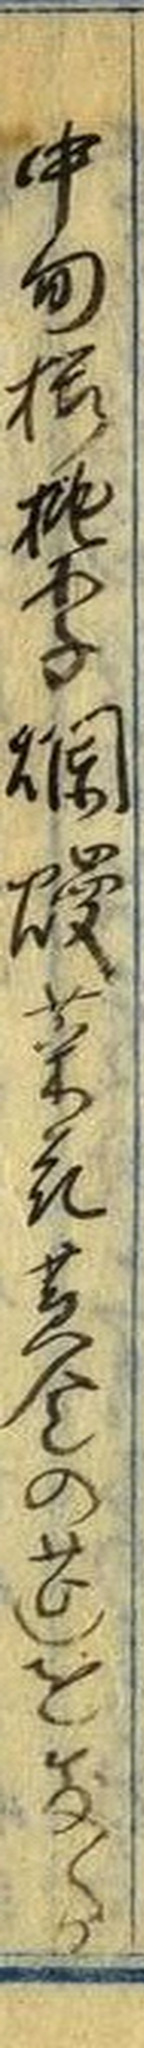中旬桜桃李爛漫菜花黄金の莚を敷くが
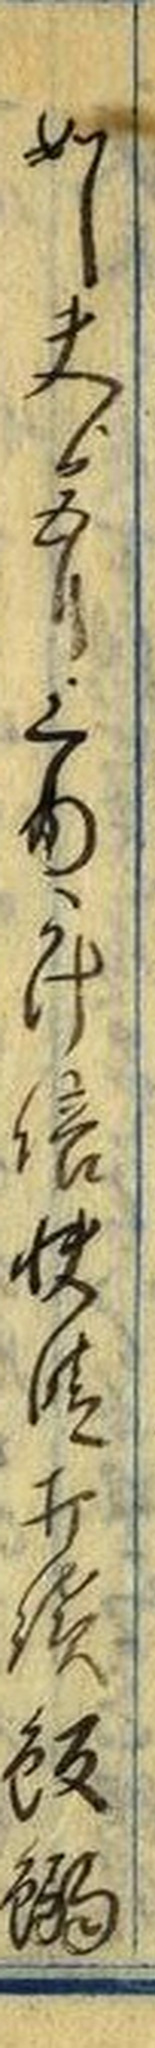如し夫ゟ五月上旬へかけ倍快晴打続魬鰯
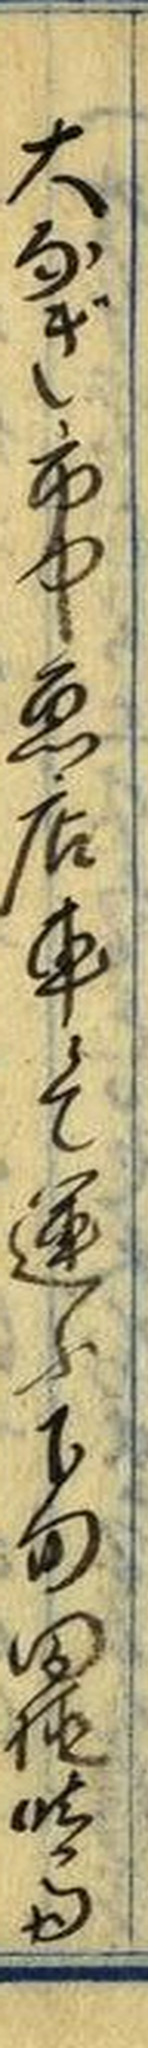大なぎ市中魚店車にて運ふ下旬田植晴雨
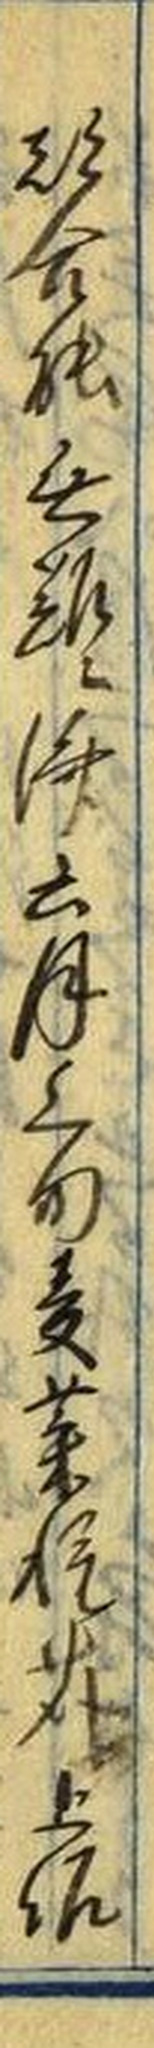都合能無難に済六月上旬麦菜種刈上作

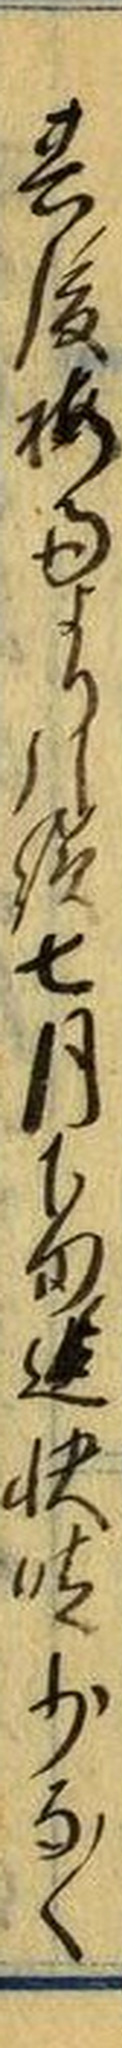其後梅雨より引続七月下旬迄快晴少なく
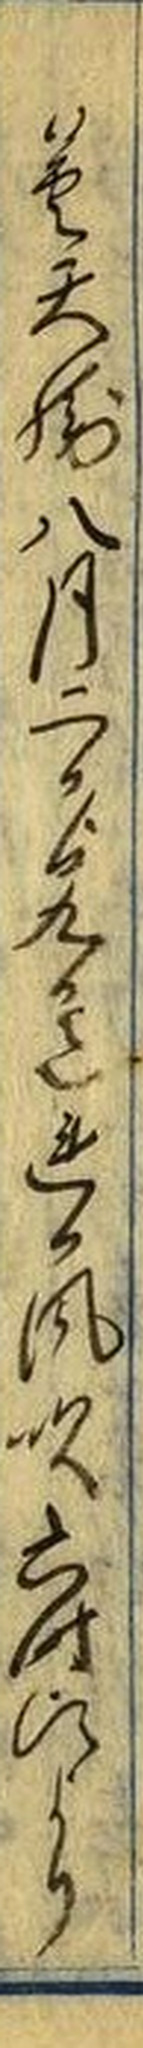曇天勝八月二日ゟ九日迄れつ風吹六時頃より
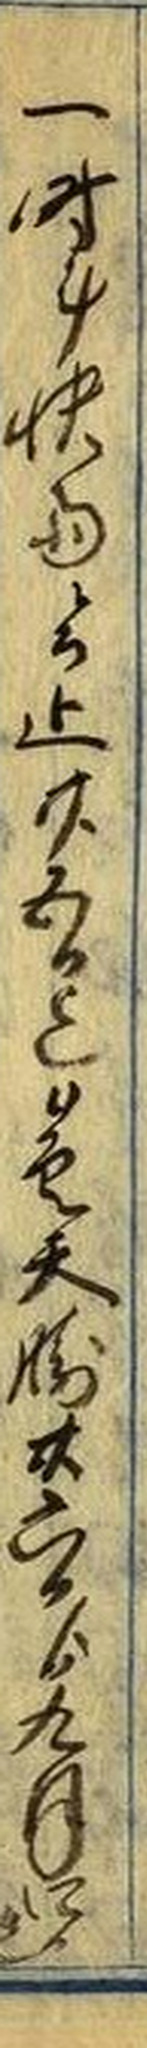一時計快雨に而止廿五日迄曇天勝廿六日ゟ九月四日迄
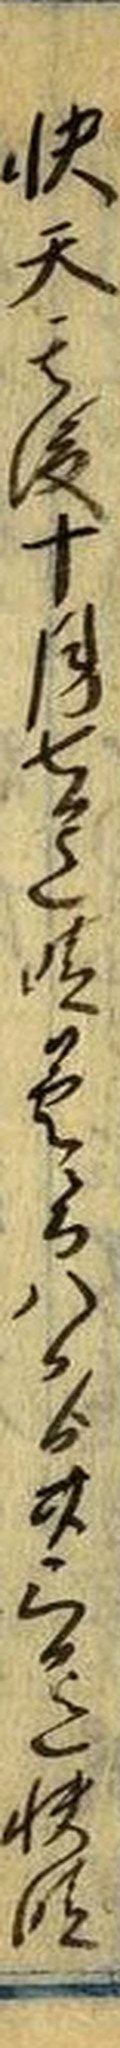快天其後十月七日迄晴曇に而八日ゟ廿三日迄快晴
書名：温古集 五巻
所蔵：福井県文書館 Fukui Prefectural Archives
